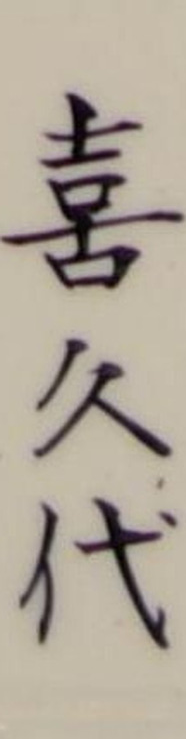喜久代
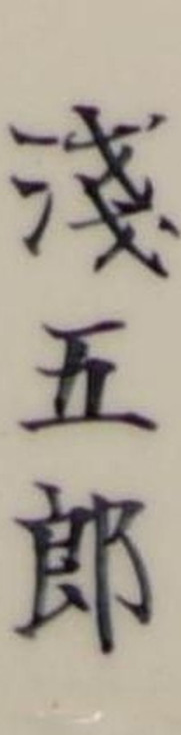浅五郎
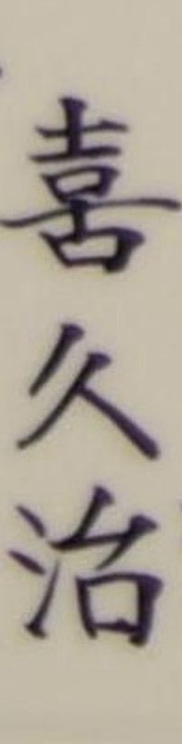喜久治
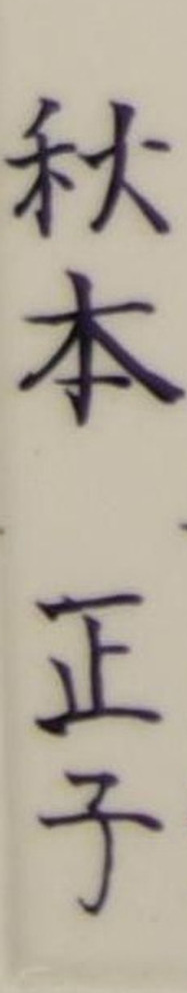秋本正子

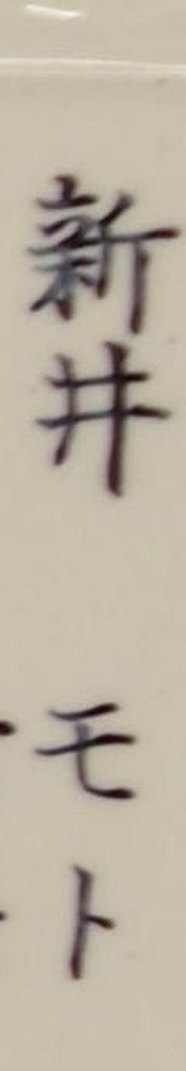新井モト
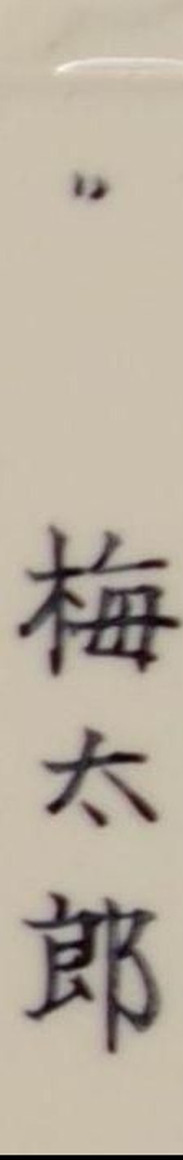梅太郎
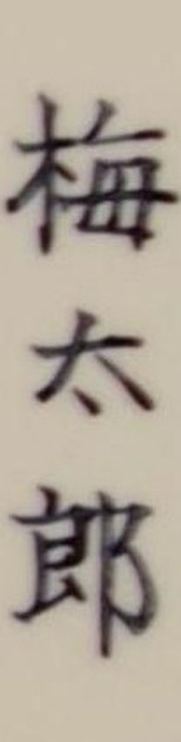梅太郎
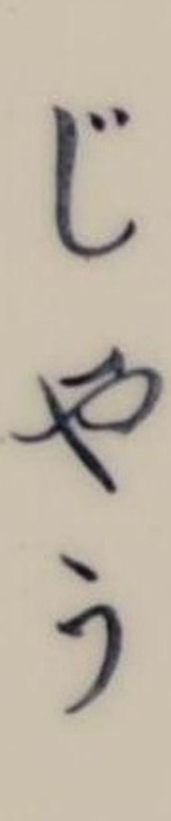じやう
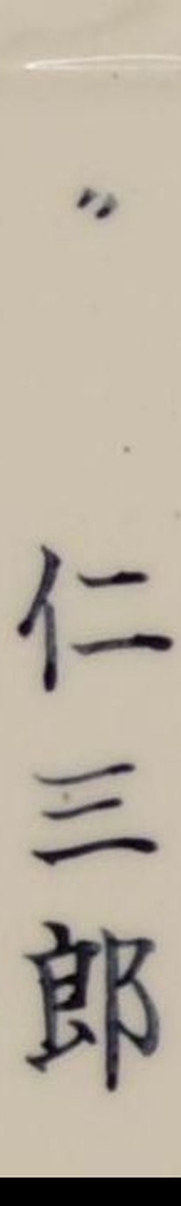仁三郎
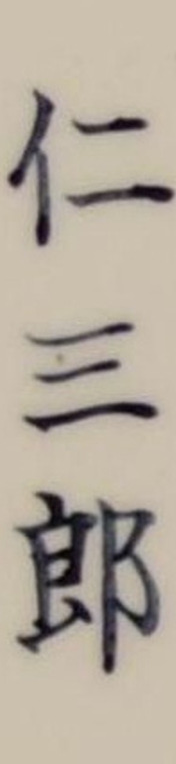仁三郎
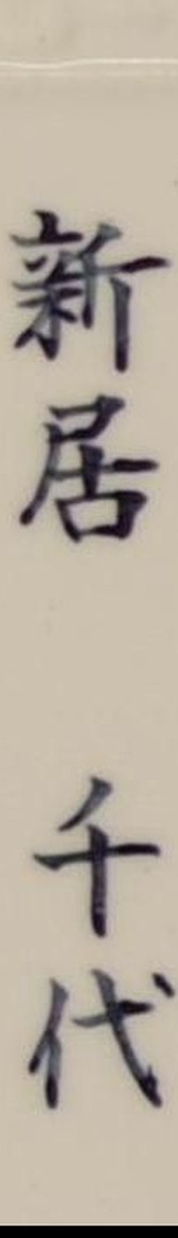新居千代
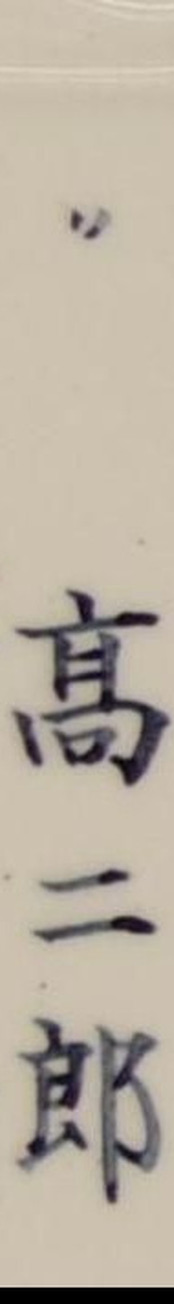高二郎
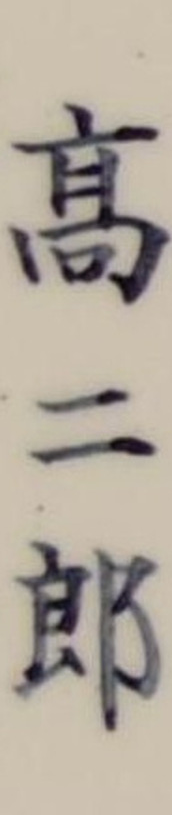高二郎
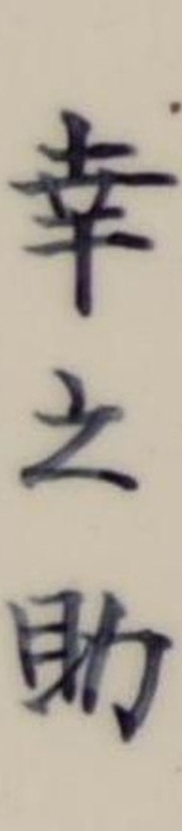幸之助
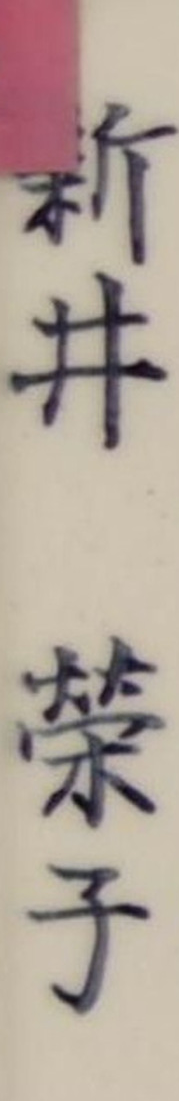新井榮子

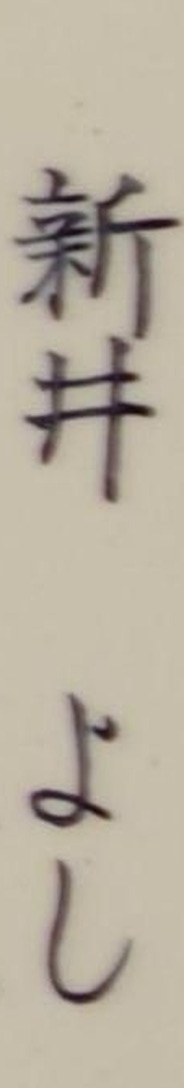新井よし
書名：E~L
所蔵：高野山金剛峯寺
